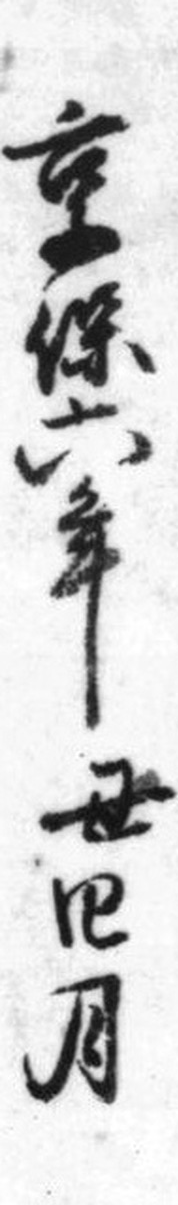享保六年丑四月
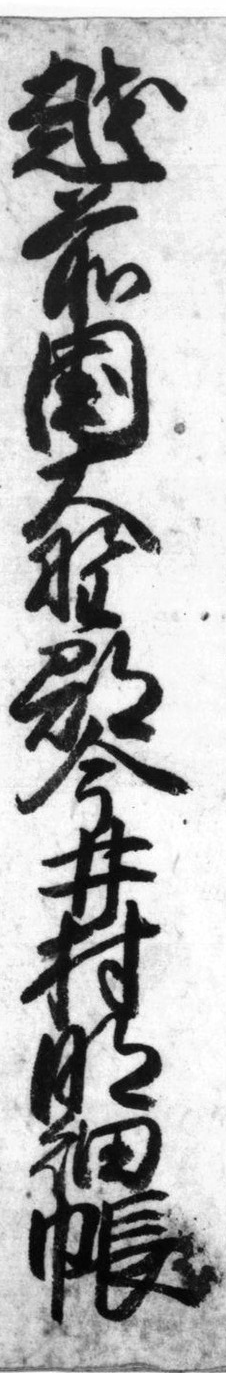越前国大野郡今井村明細帳
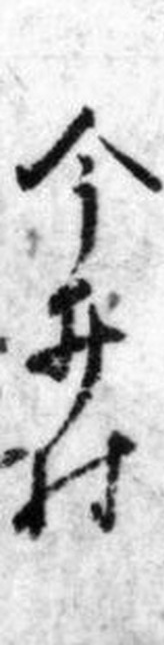今井村
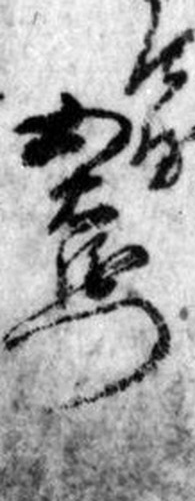五右衛門

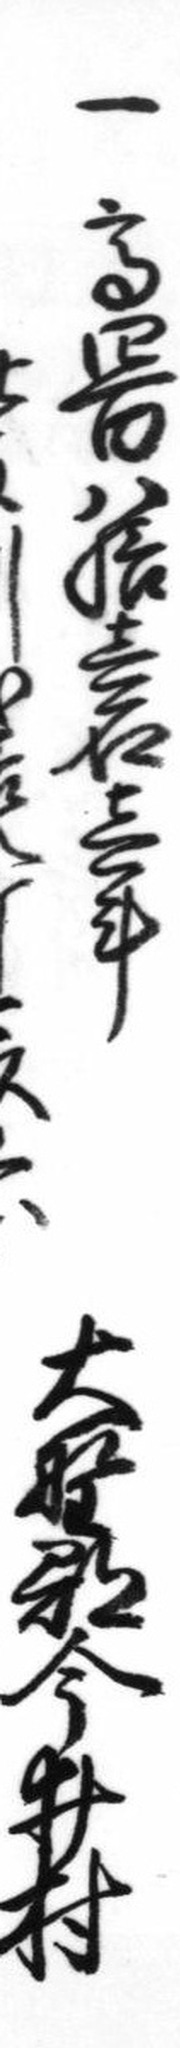一高四百八拾壱石壱斗大野郡今井村
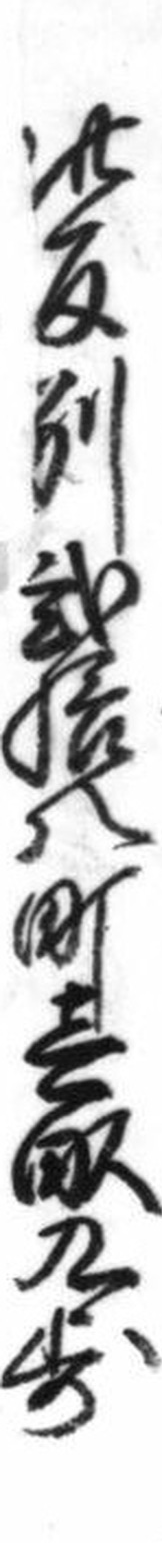此反別弐拾八町壱畝九歩
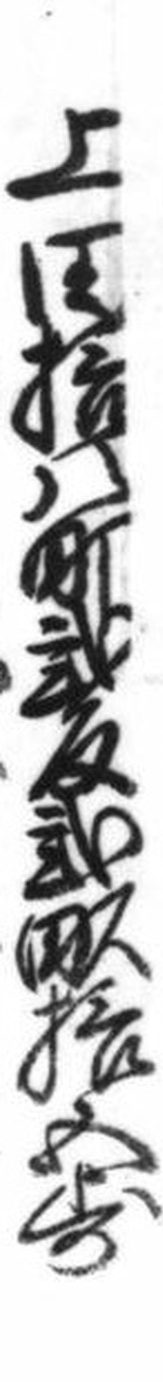上田拾八町弐反弐畝拾五歩
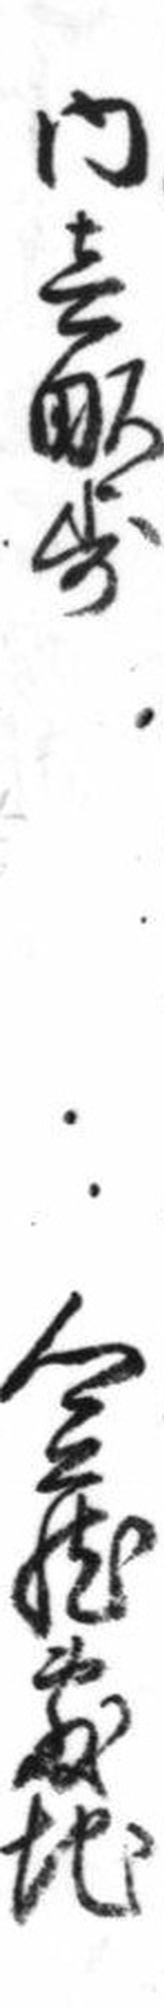内壱畝歩郷蔵敷地
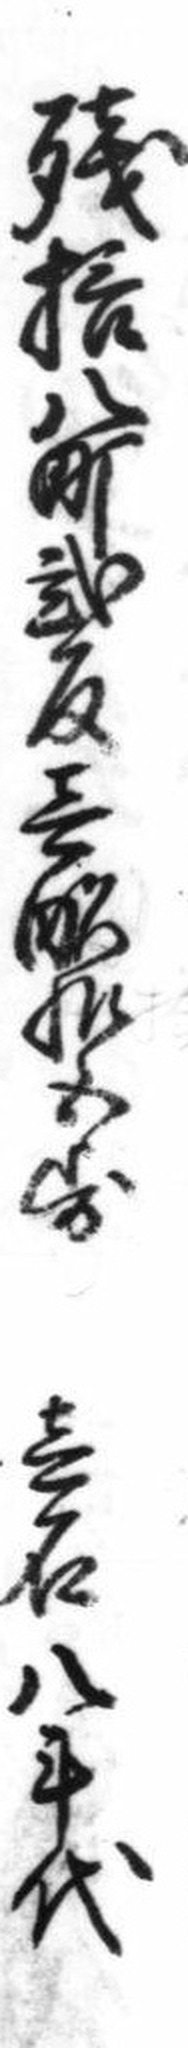残拾八町弐反壱畝拾五歩壱石八斗代
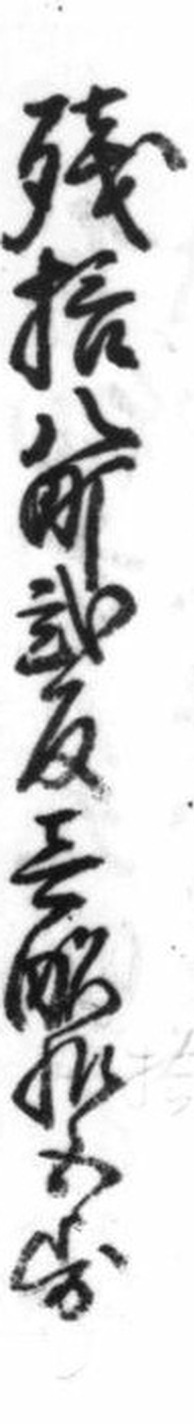上田拾八町弐反弐畝拾五歩
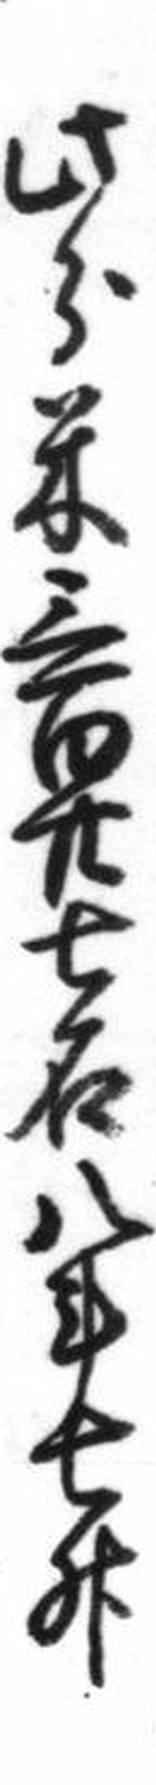此分米三百廿七石八斗七升
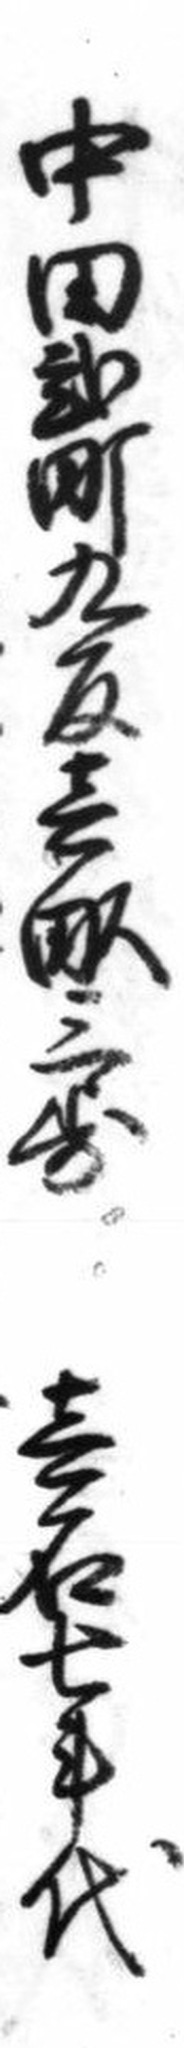中田弐町九反壱畝三歩壱石七斗代
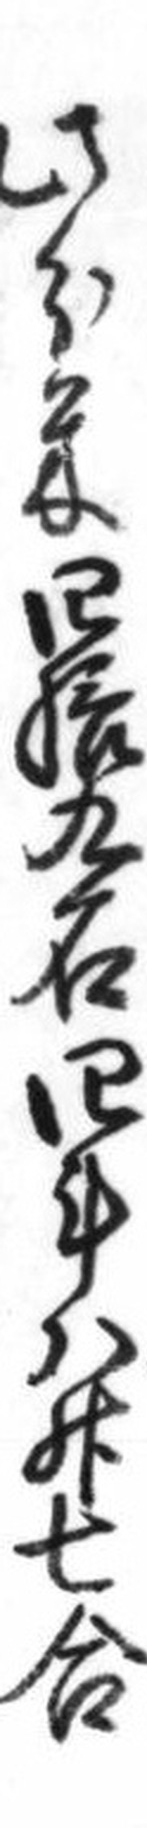此分米四拾九石四斗八升七合
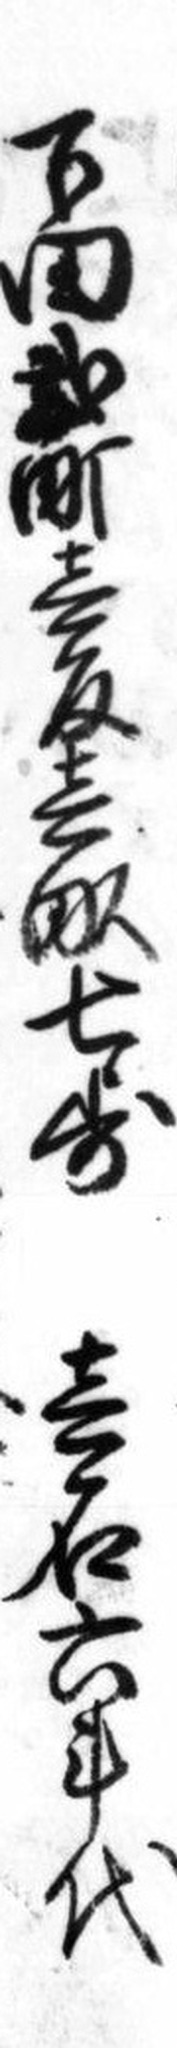下田弐町壱反壱畝七歩壱石六斗代
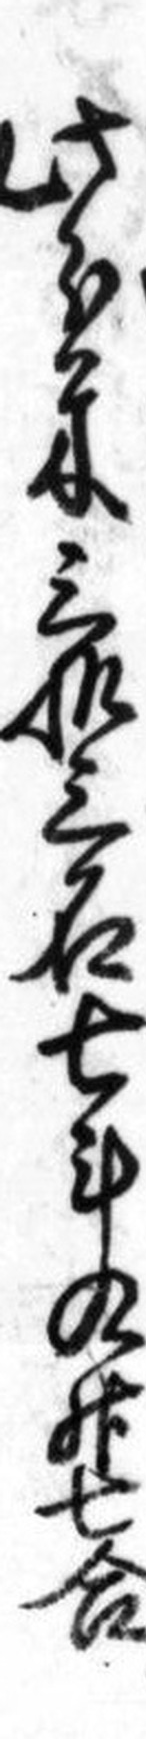此分米三拾三石七斗九升七合

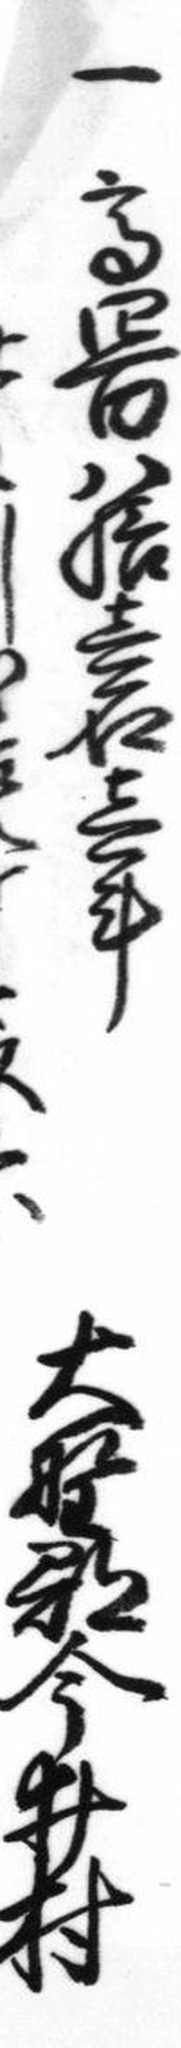一高四百八拾壱石壱斗大野郡今井村
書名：越前国大野郡今井村明細帳
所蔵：福井県文書館 Fukui Prefectural Archives
